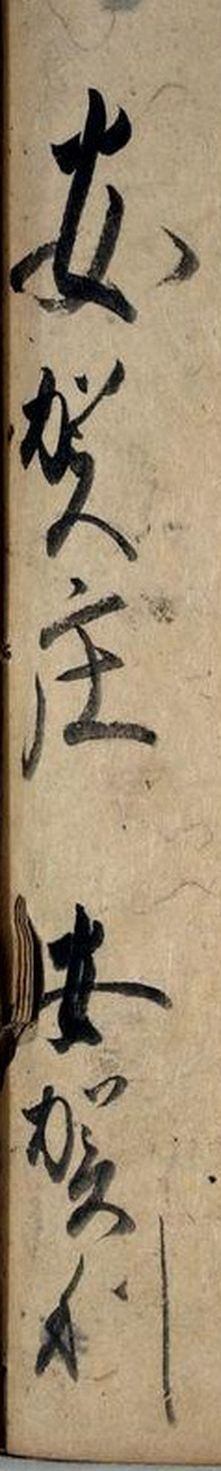安賀庄安賀利
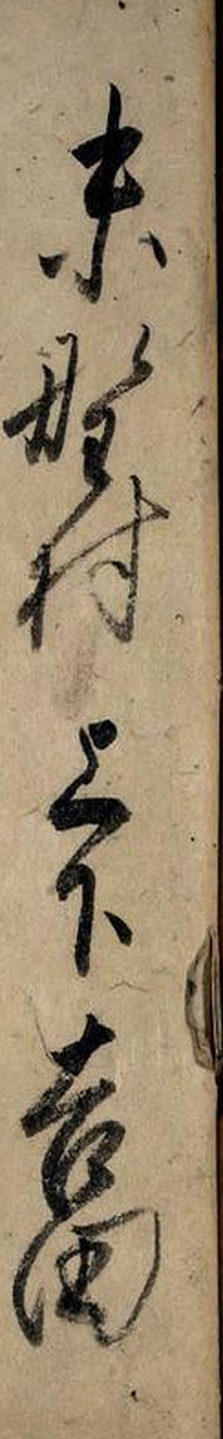東野村上下吉田
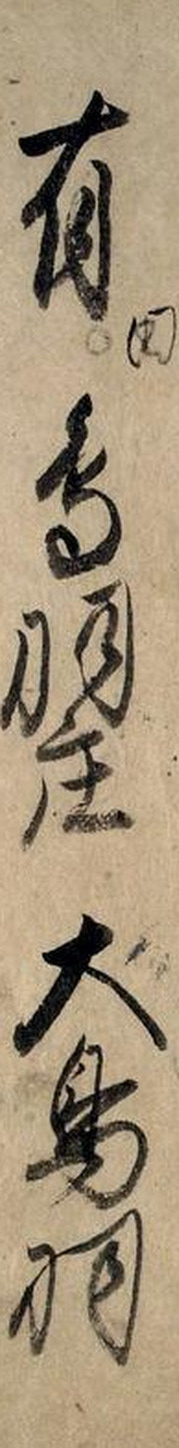有田鳥羽庄大鳥羽
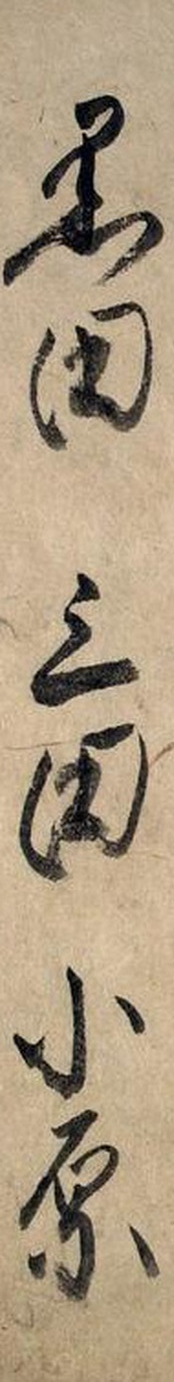黒田三田小原

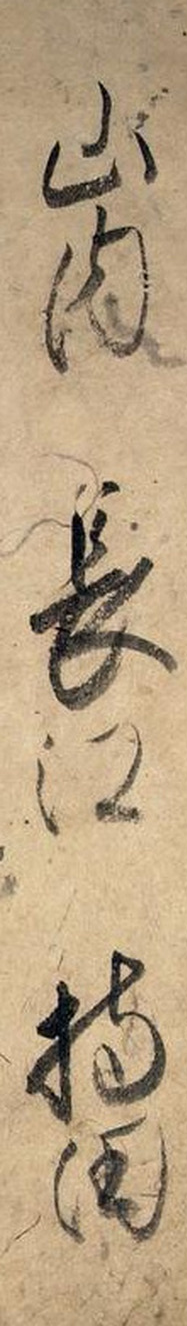山内長江持田
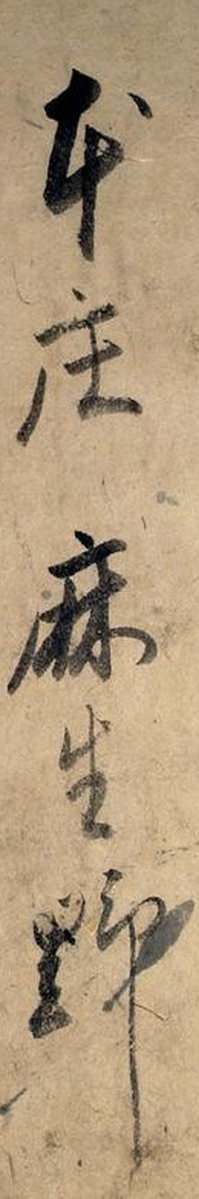本庄麻生野
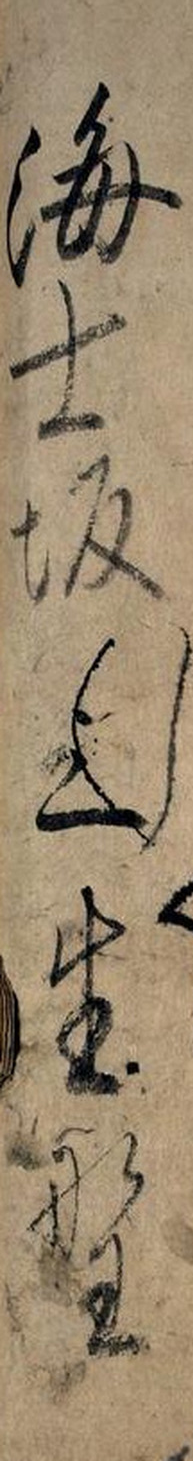海士坂三生野
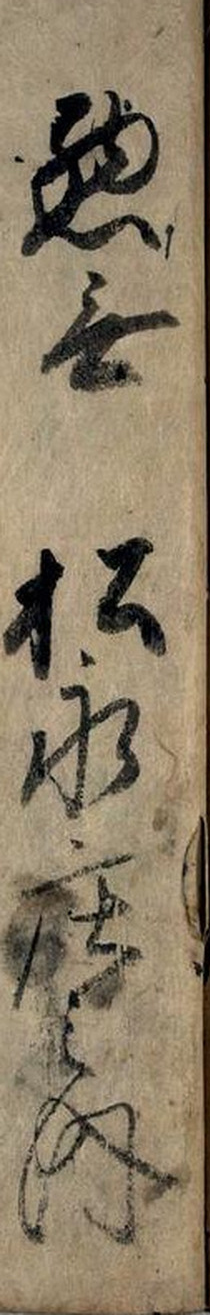悪無松永庄之内
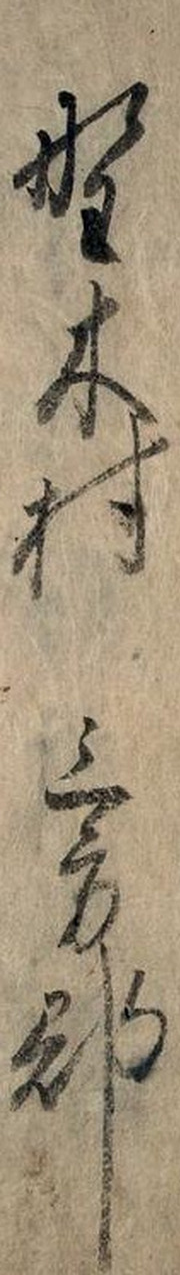野木村三方郡
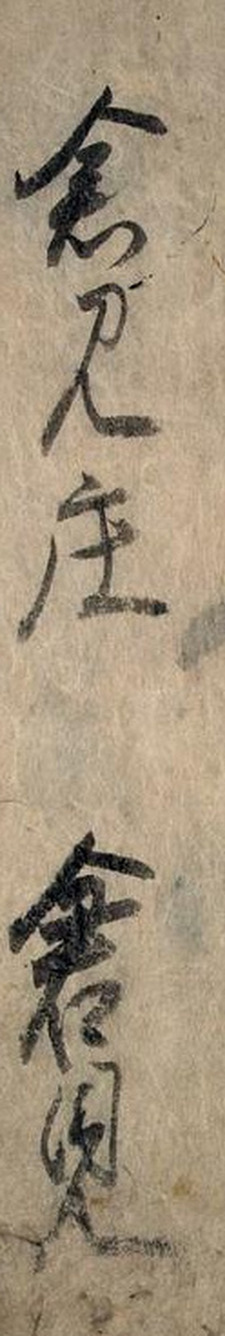倉見庄倉見

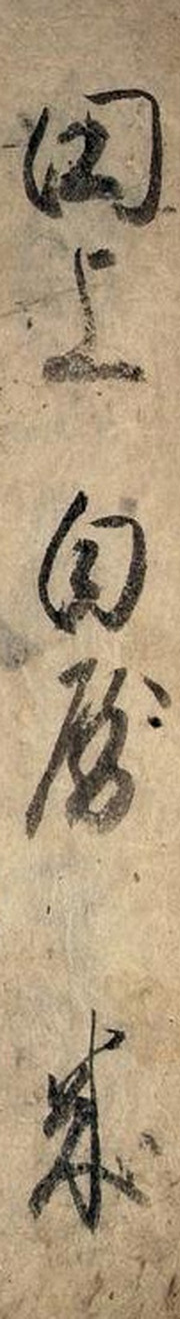田上白屋成
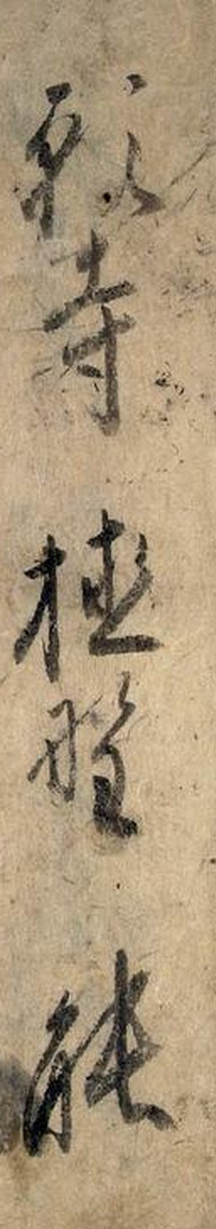願寺植野能
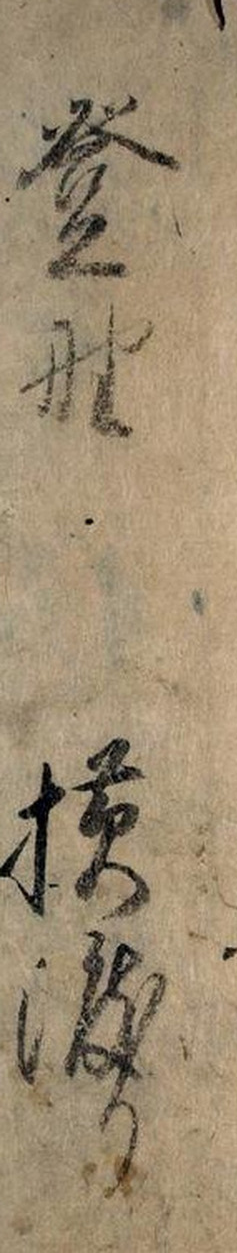登野横渡リ
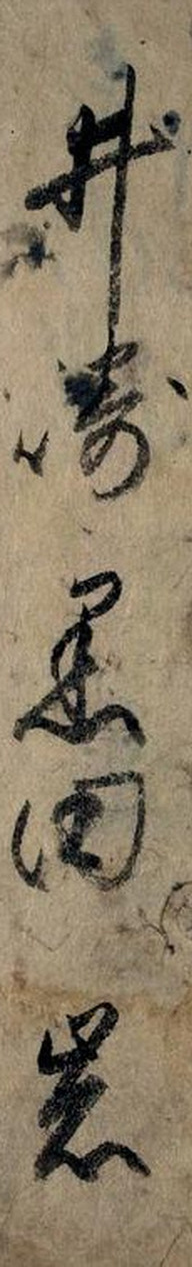井崎黒田岩
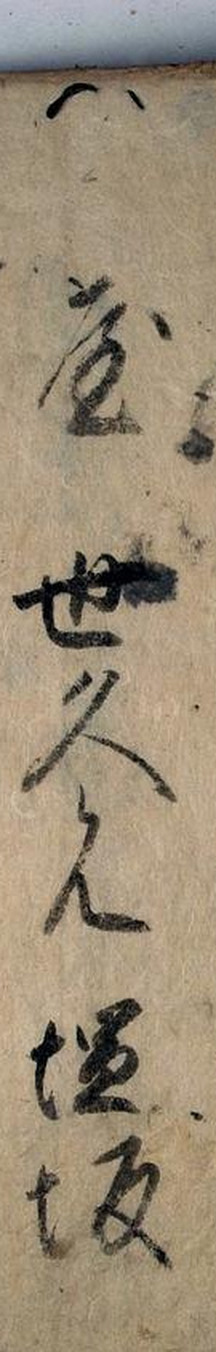屋世久見塩坂
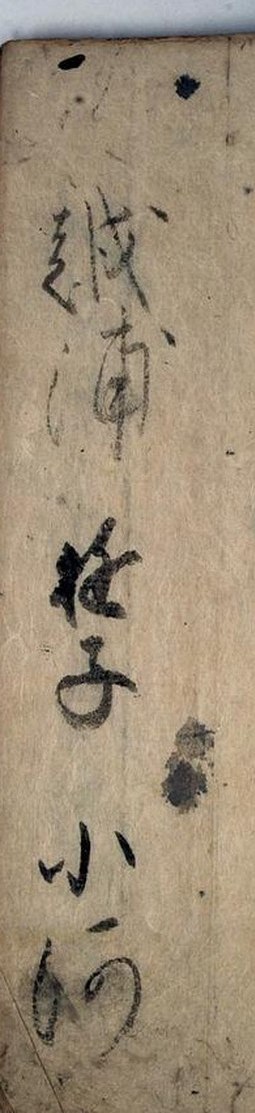越浦遊子小河
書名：御手本（手習、家号之事、小浜商家の屋号）
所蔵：福井県文書館 Fukui Prefectural Archives
